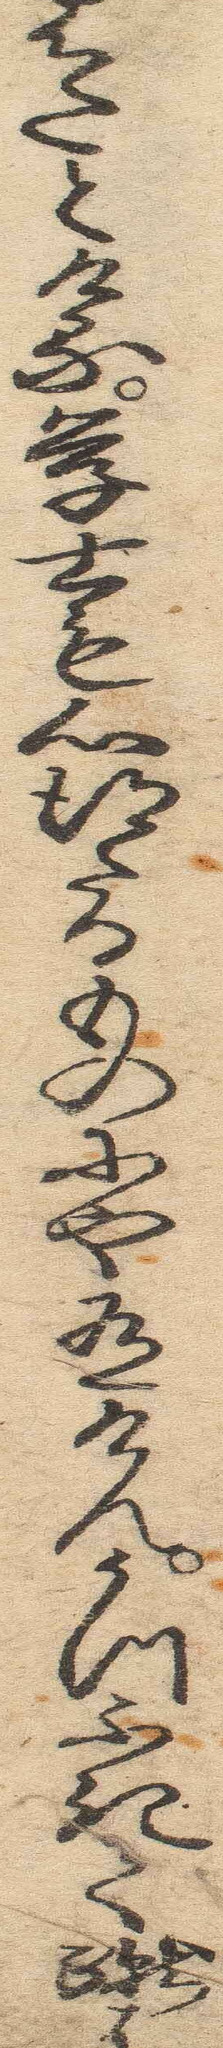はたとける。学士も心得たるものにや有けん。うつふきて蹴は
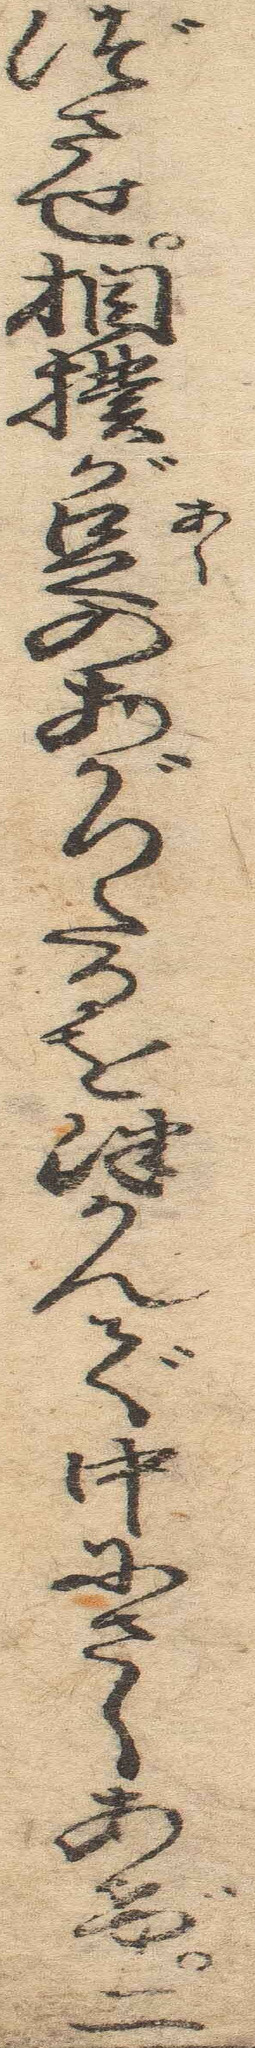ずさせ相撲が足のあがりたるをつかんで中にさしあげ。二
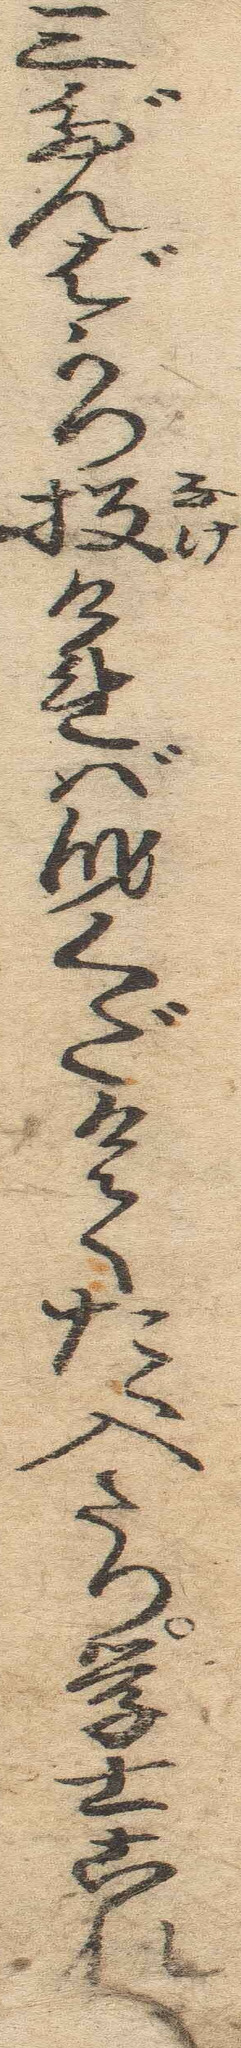三だんばかり投ければ身くだけてたへ入たり。学士これをば
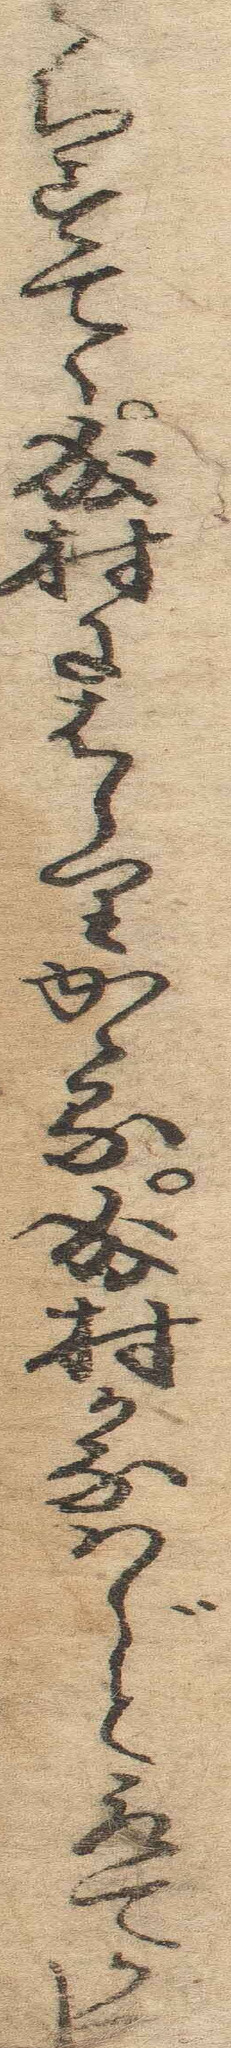うちすてゝ。成村にはしりかゝる。成村かなはじと取てかへし

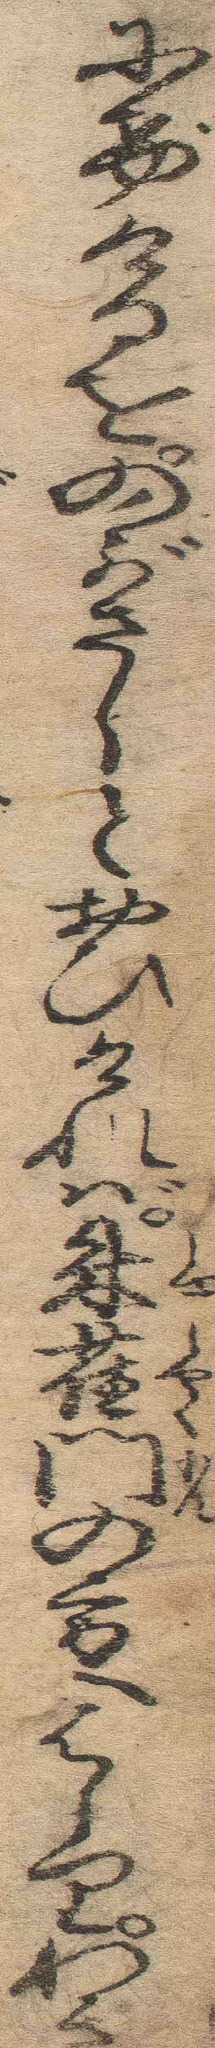にげけるを。のがさじとおひければ。朱雀門の方へはしり。わき
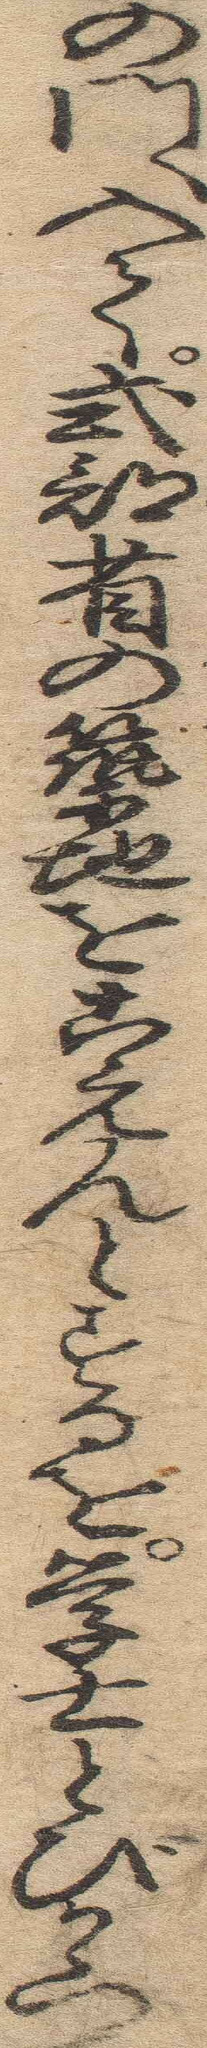之門へ入て。式部省の築地をこえんとするを。学士とびかゝりて
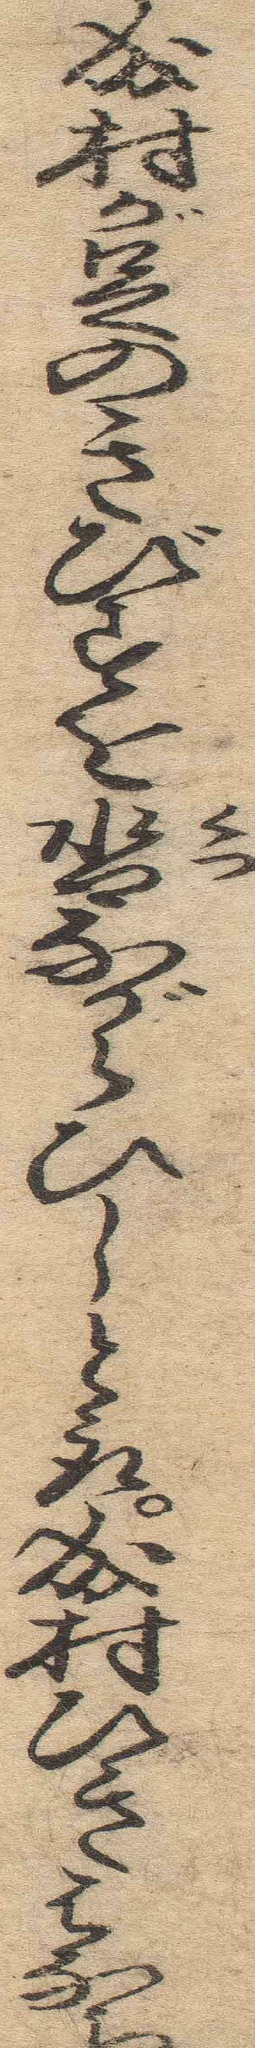成村が足のきびすを沓ながらひしと取。成村ひきはなち
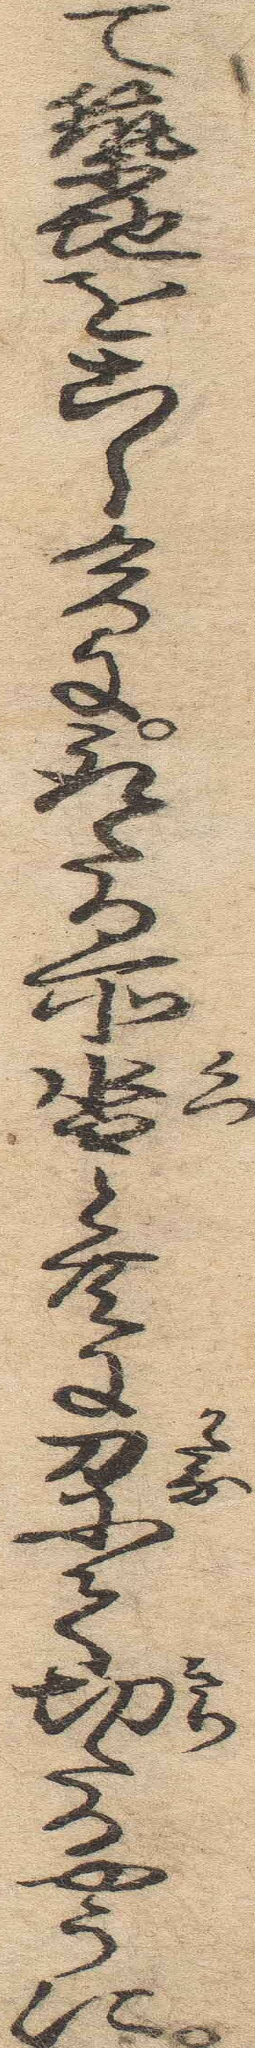て築地をこしけるに。取たる所沓と共に刀にて切たるやうに。
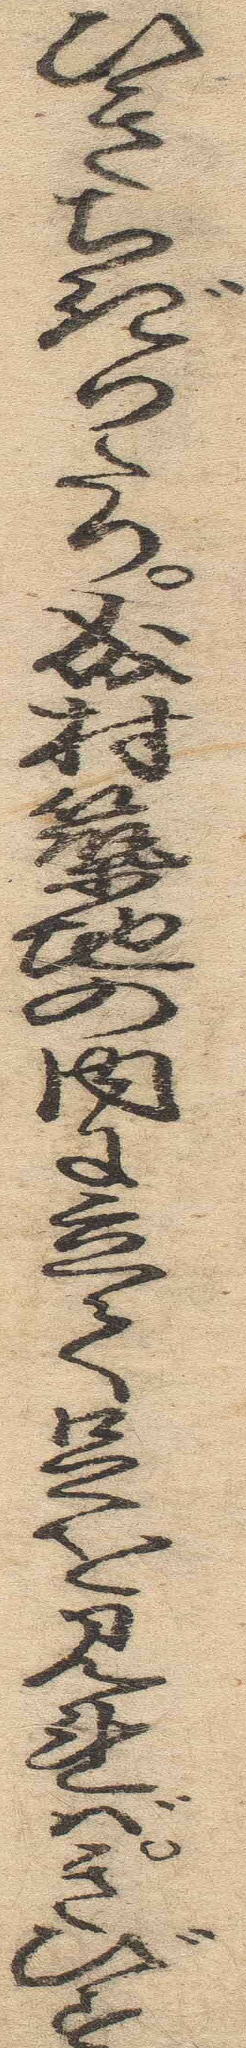ひきちぎりたり成村築地の内に立て足を見れば。きびす
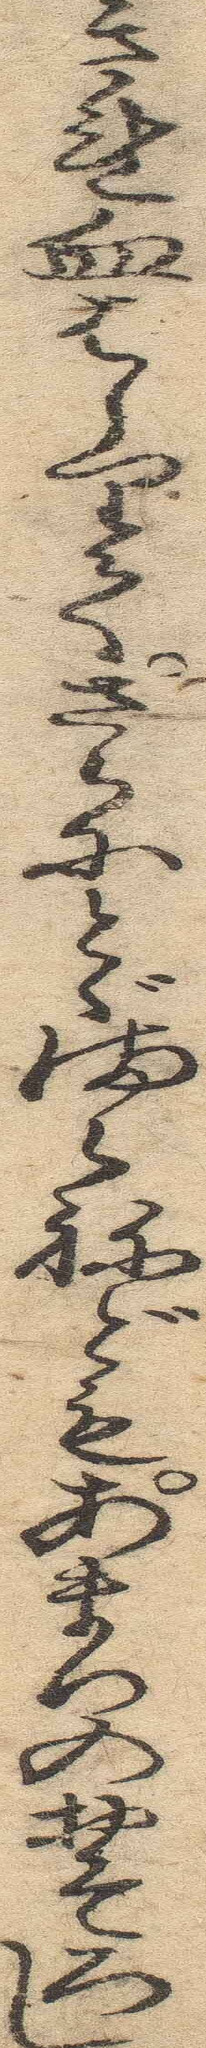きれ血はしりて。さらにとゞまらねども。あまりのおそろし
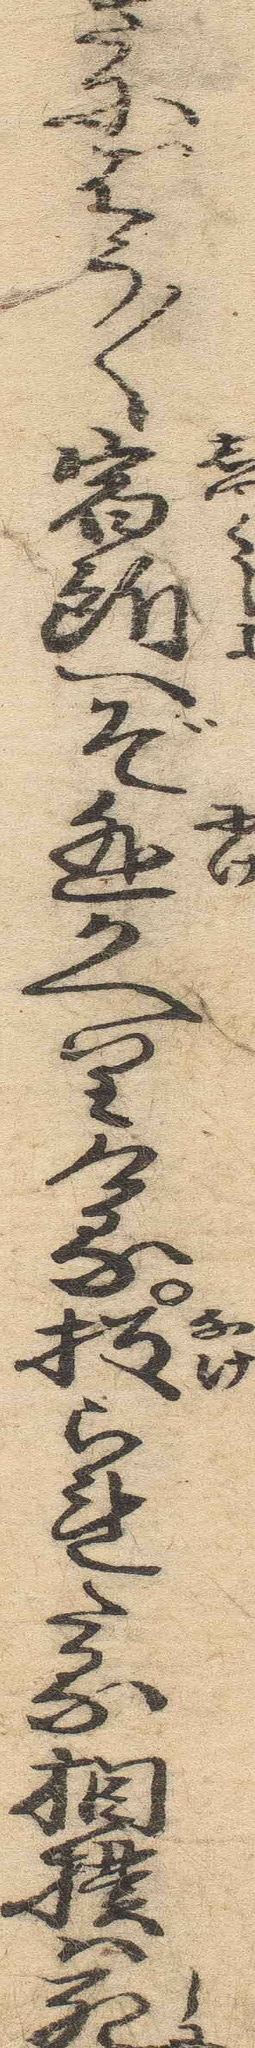さに。はう〳〵宿所へそ逃かへりける。投られたる相撲は死
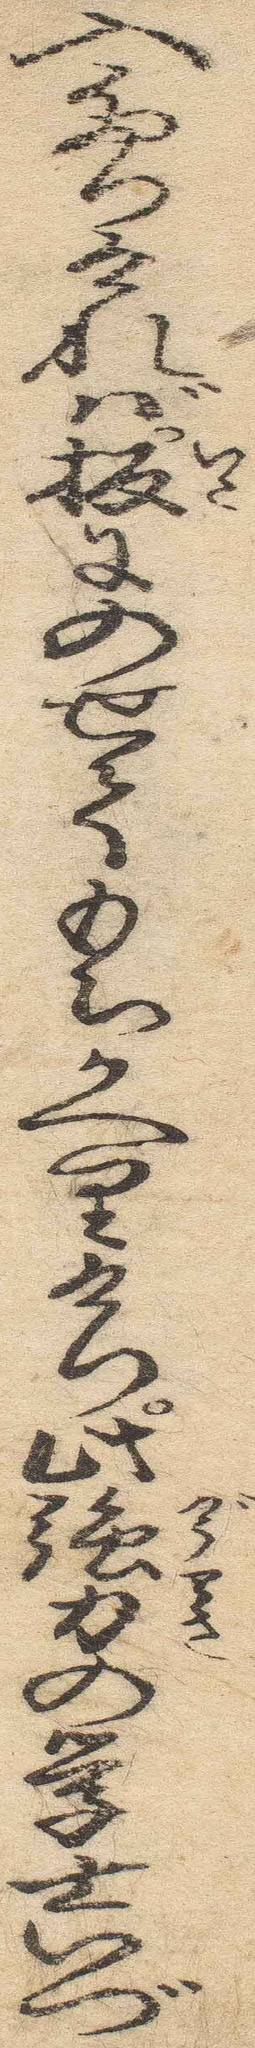入たりければ。板にのせてもちかへりけり。此強力の学士いづ
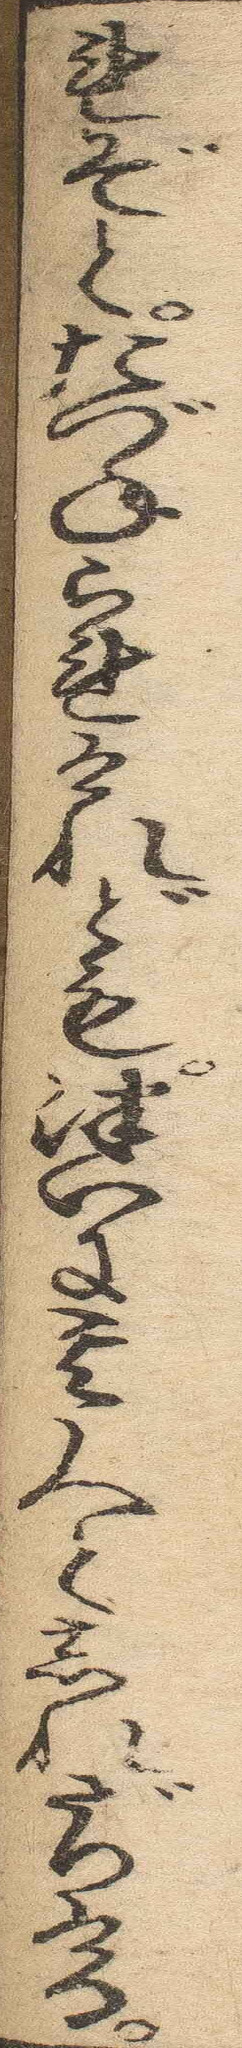れぞと。たづねられけれども。ついに其人しれざりける。
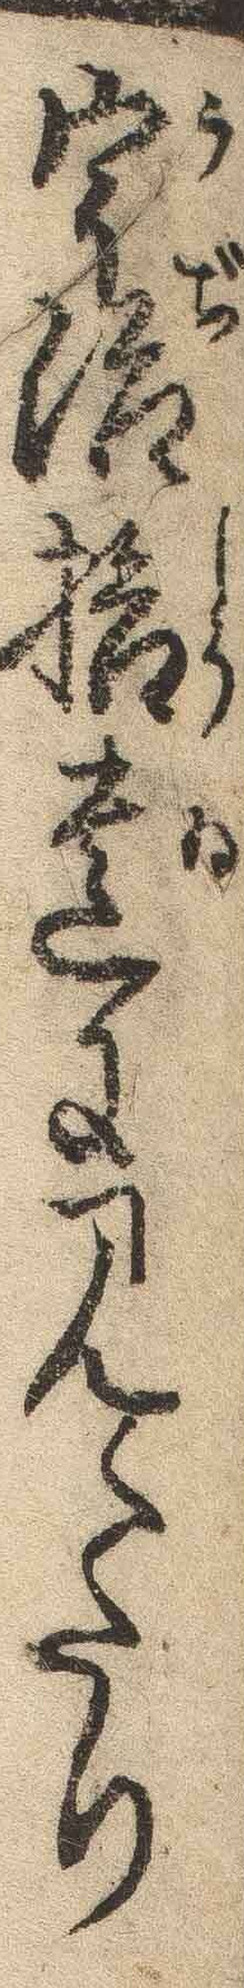宇治拾遺に見へたり
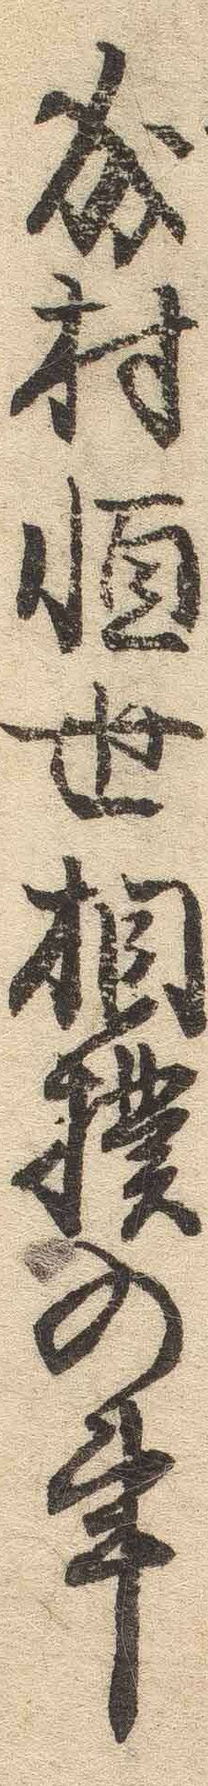成村恒世相撲の事
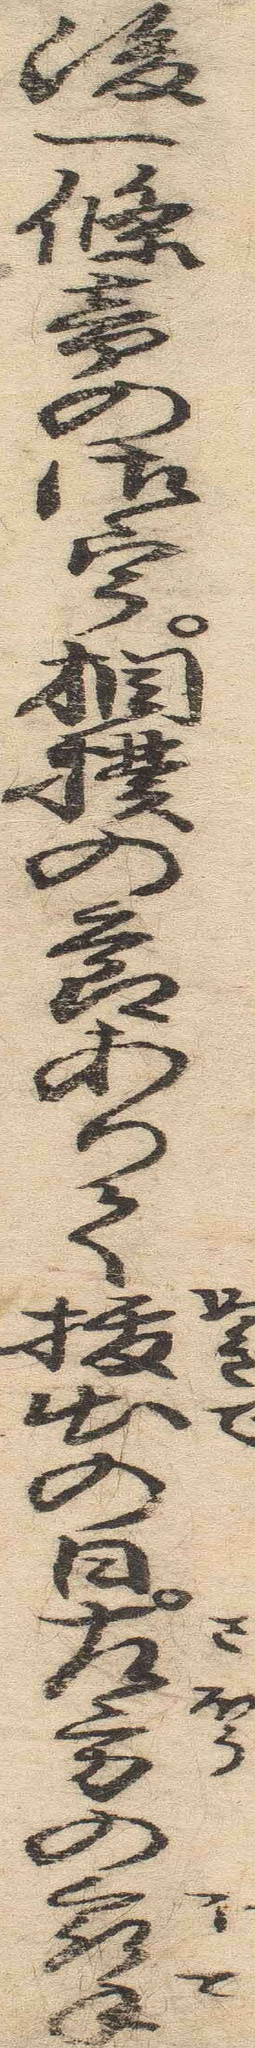後一條帝の御宇。相撲の節ありて抜出の日左方の最手
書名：古今相撲大全
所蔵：東京学芸大学附属図書館 国文学研究資料館
